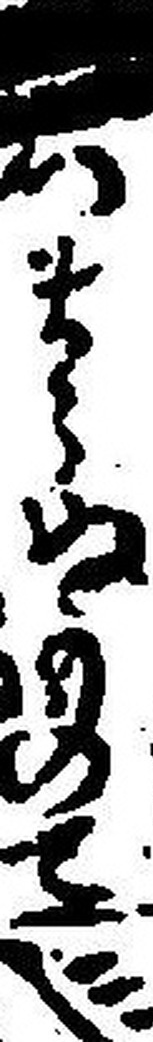つまらぬものて
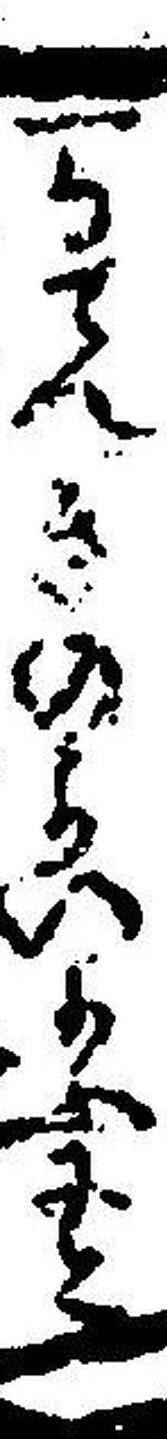一日てんきのよいよふにと
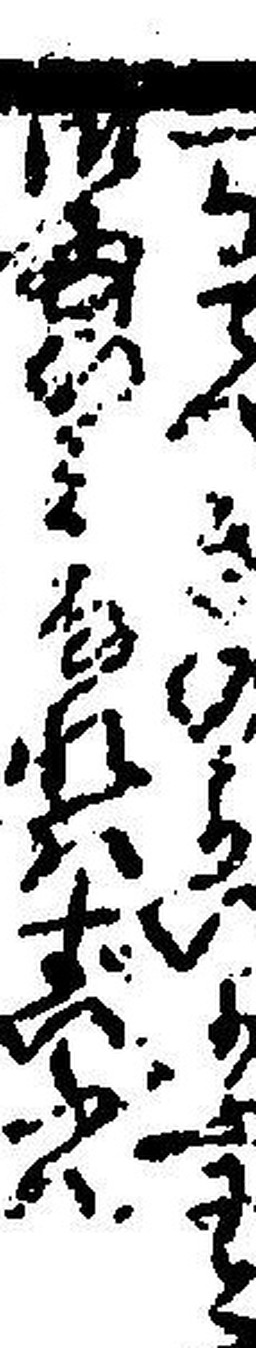御たのみなれはずいぶん
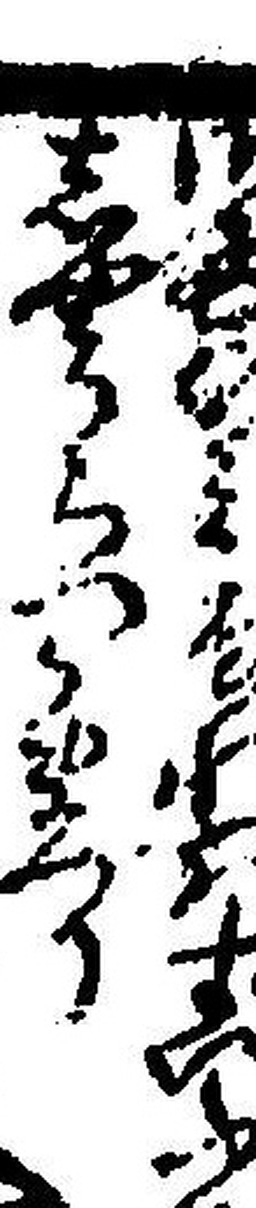しやうちつかまつり
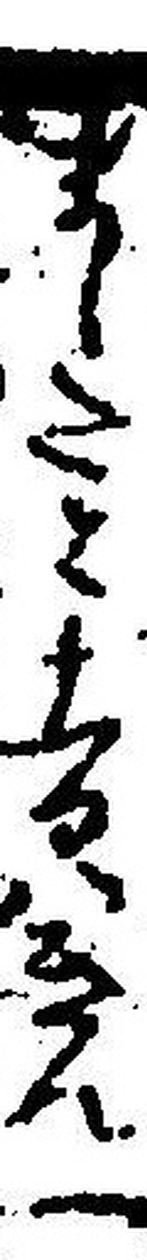ましたと十一日はきん
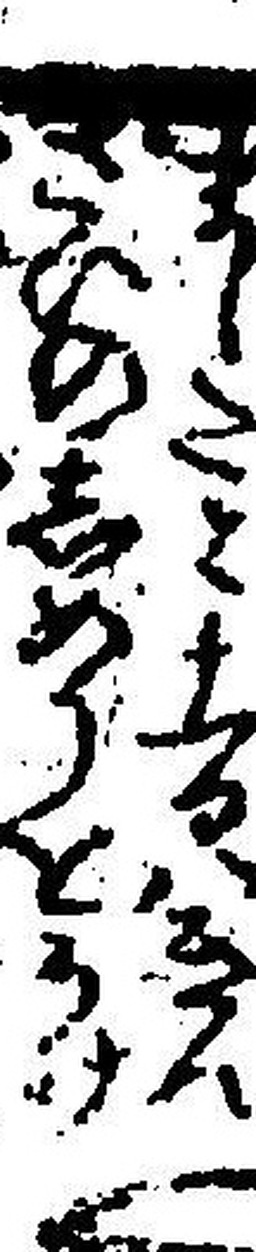ざいのしめりをうけ
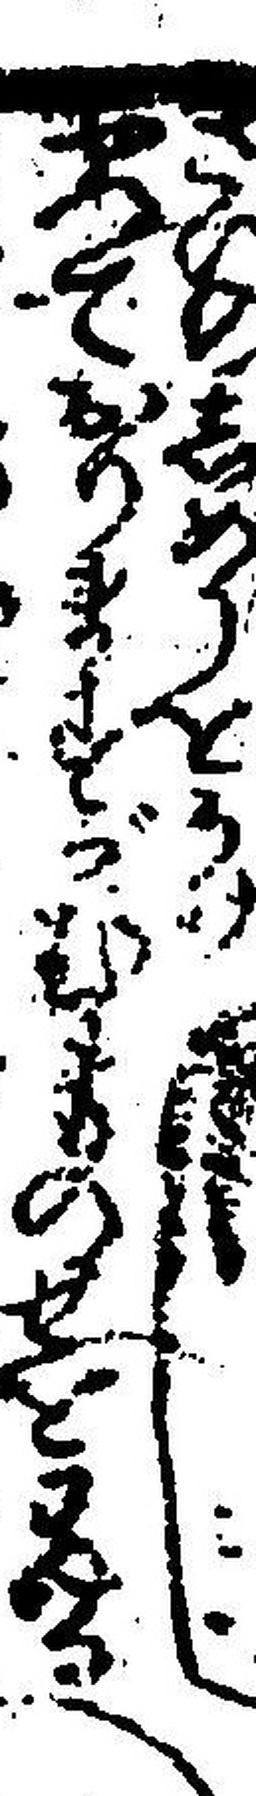やつておりますがむまのせをわける
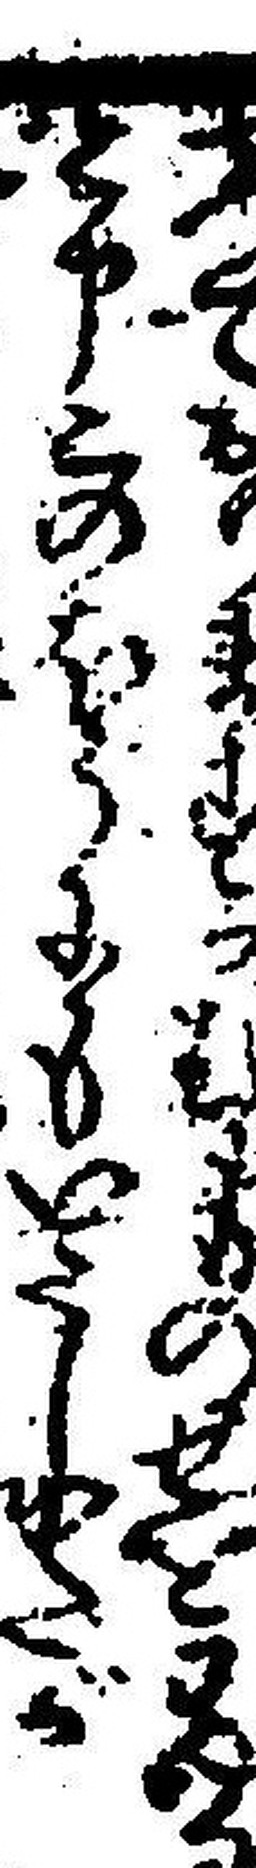と申このほうにもいたしかたが
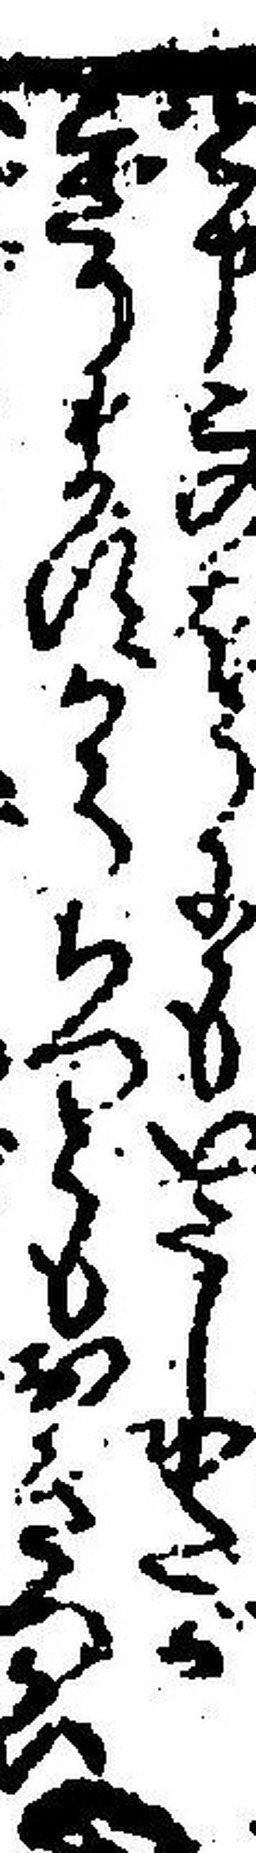ござりますからちつともおきつかい
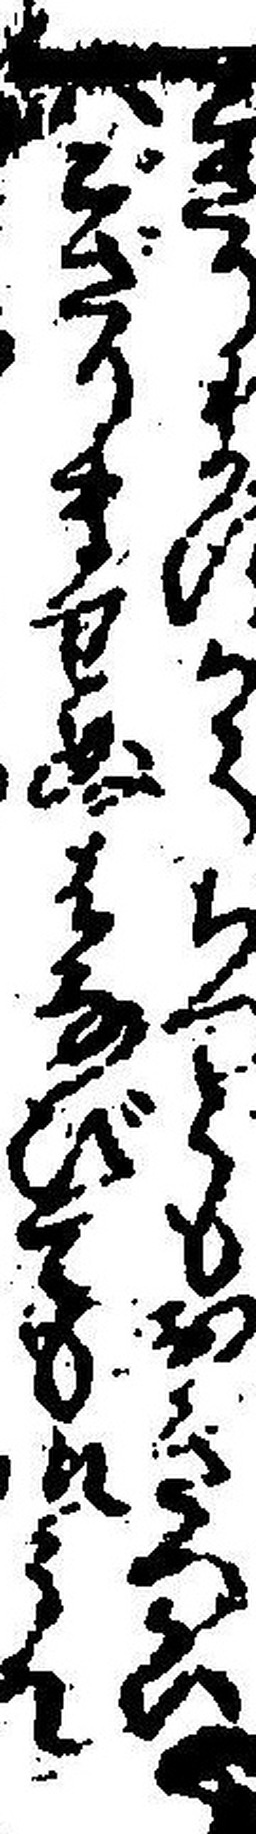はござりませぬはなびても御らん
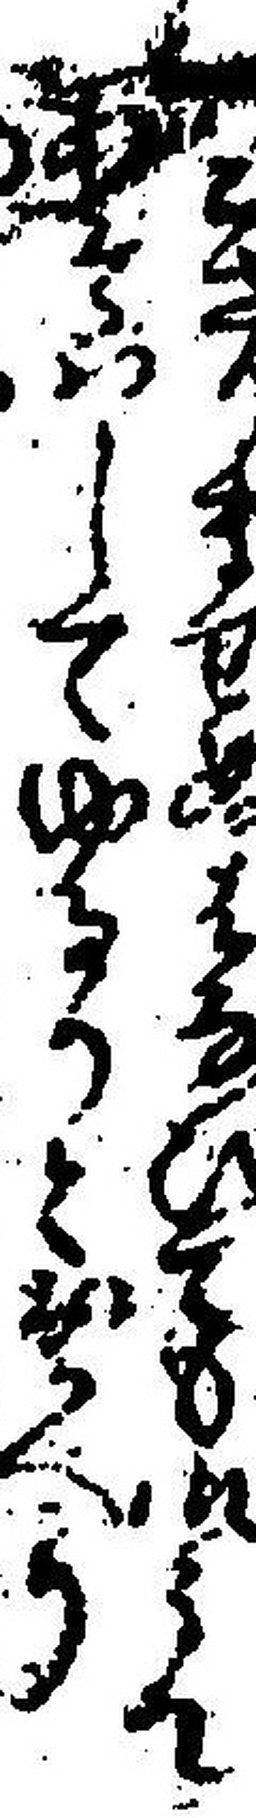あそはしてゆるりとおかへり
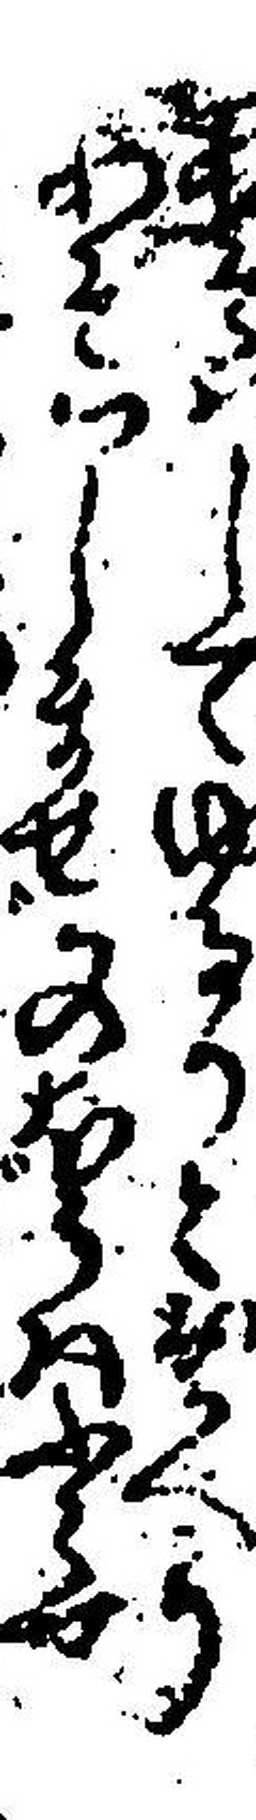あそはしませかのほうはふらせ
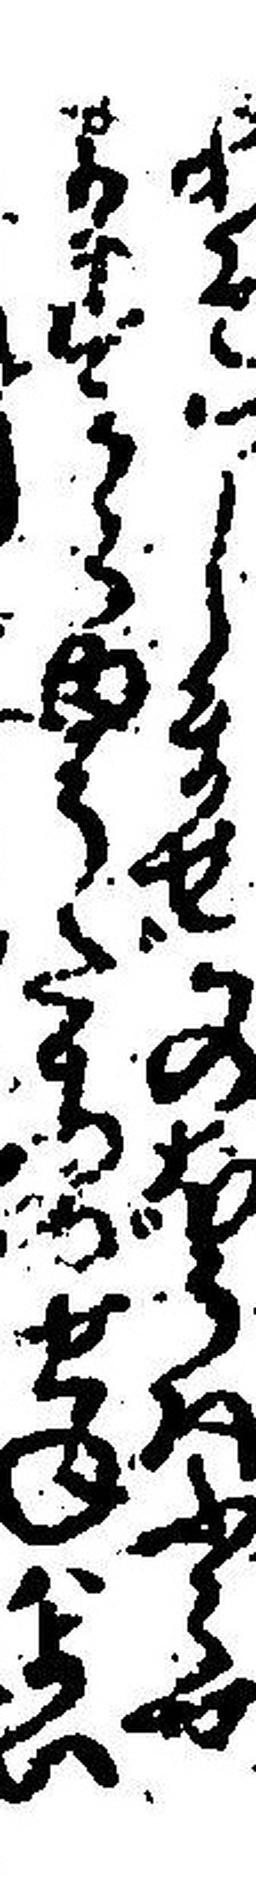ますからゆうだちがせねはよい
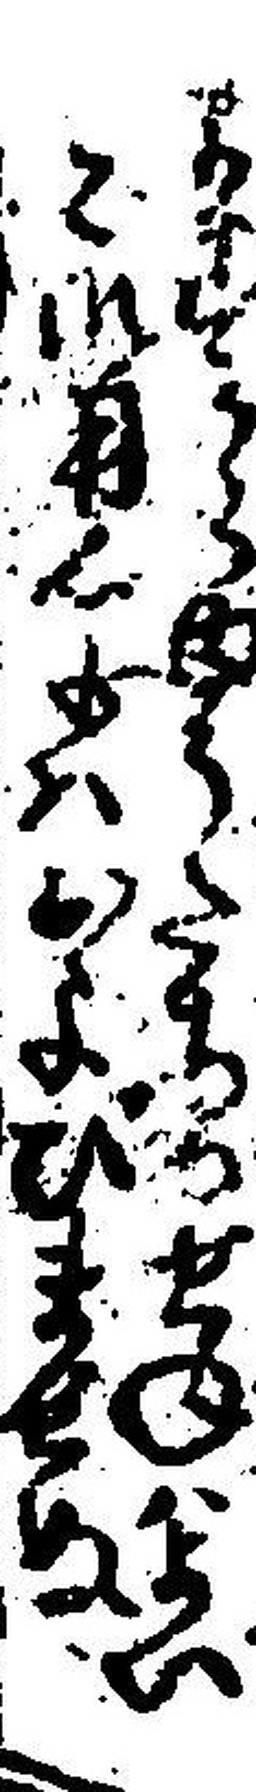と後用心にはおよびませぬ

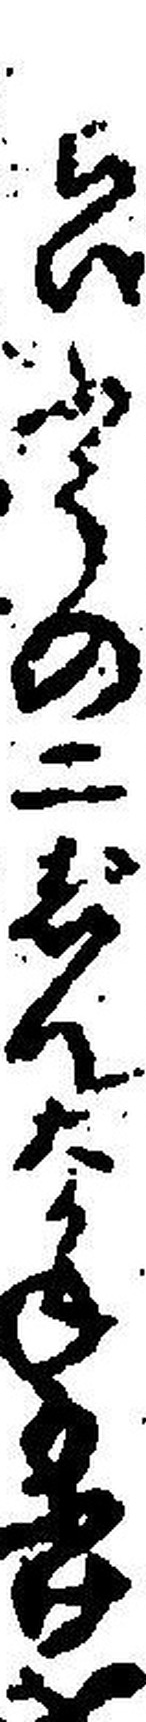らいふうの二じん大かねもふけを
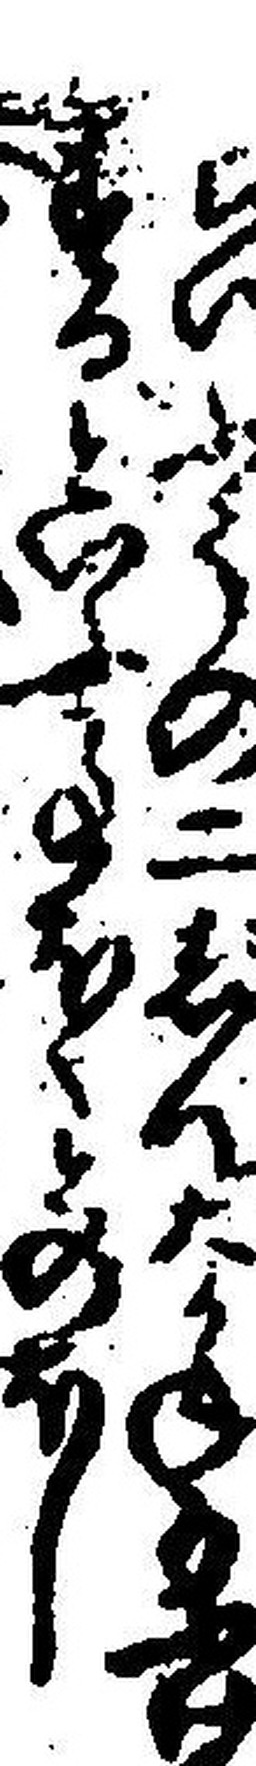するといふ事ほくとのほし
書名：天竺儲之筋 / 市場通笑作
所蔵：東京大学総合図書館 General Library in the University of Tokyo, JAPAN
